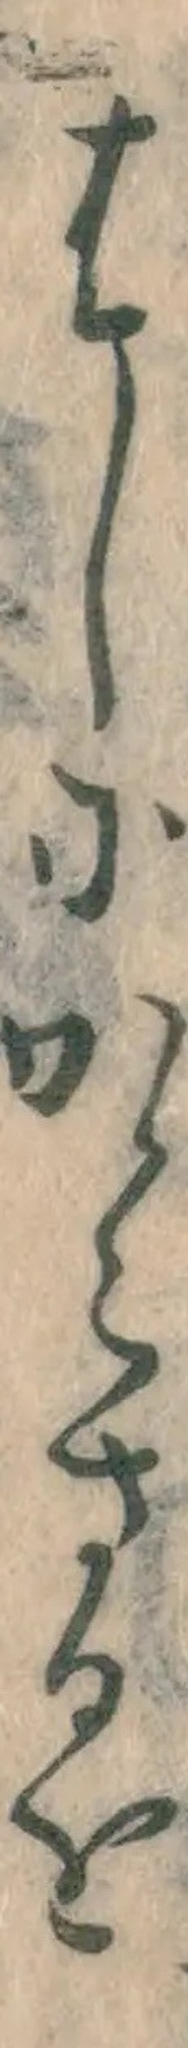はしにかゝらさるを

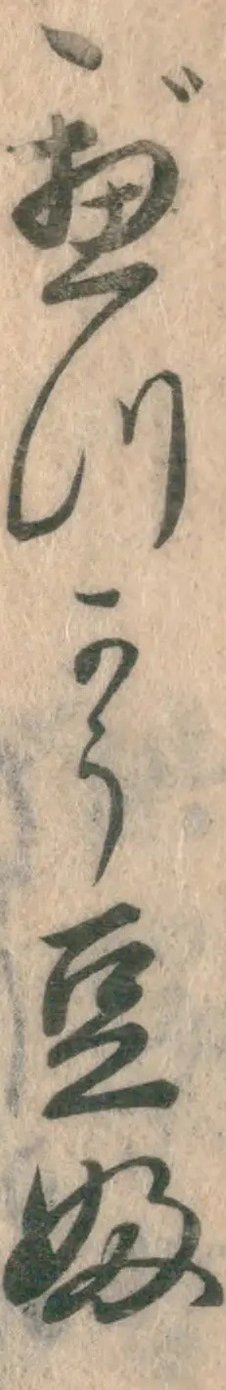べつかう豆ふ
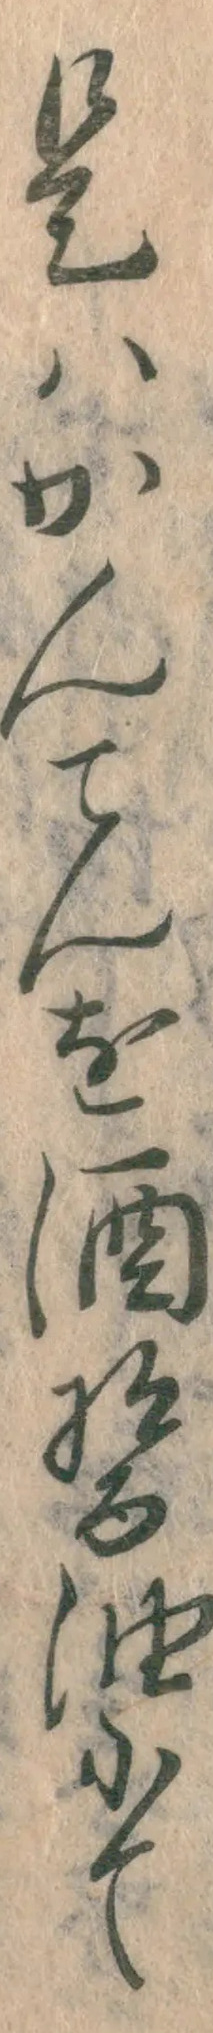是はかんてんを酒醤油にて
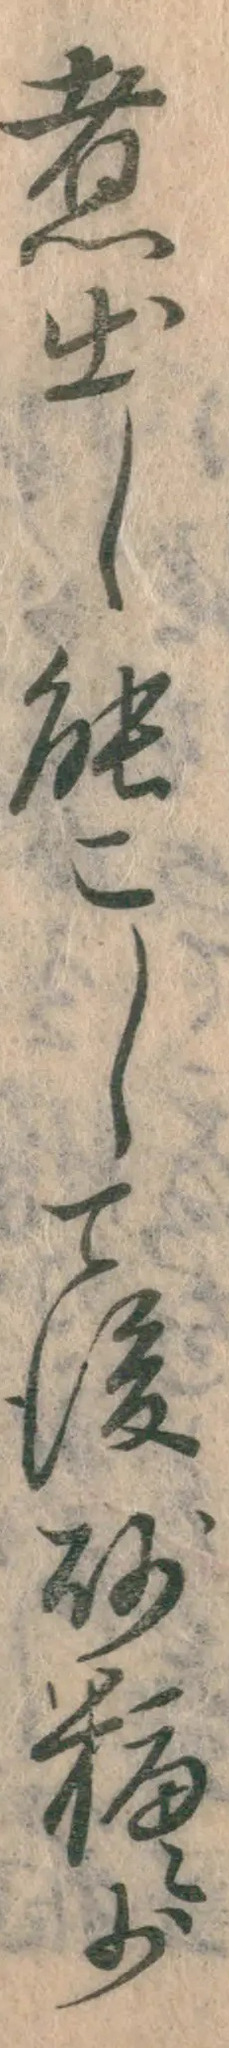煮出し能こして後砂糖少
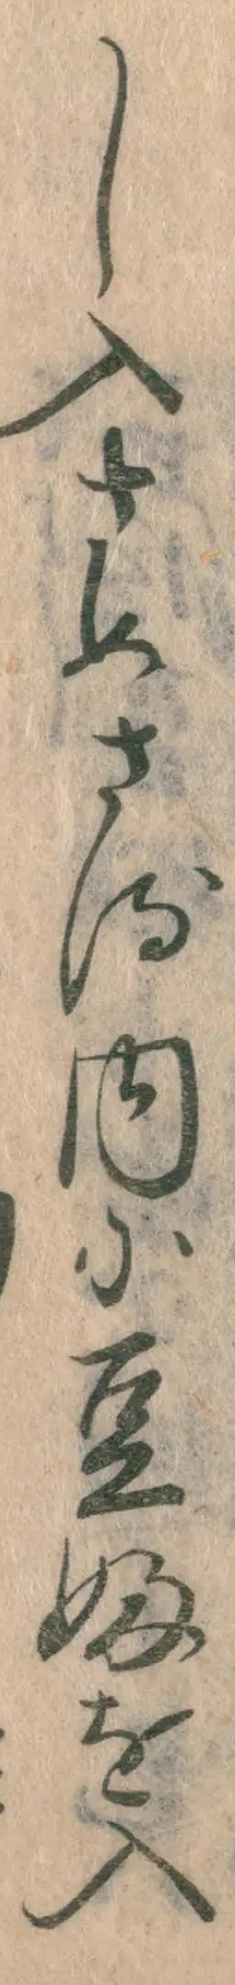し入さめさる内に豆ふを入
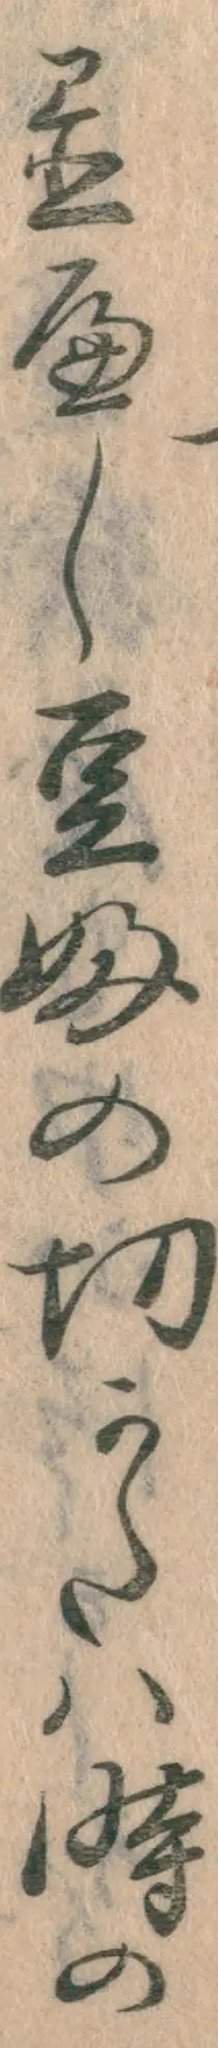置へし豆ふの切かたは時の
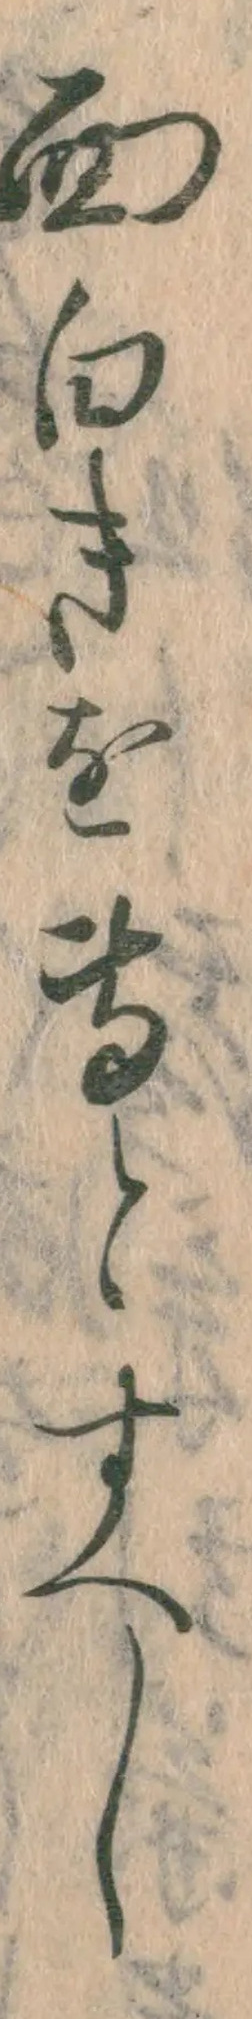面白きを専とすへし
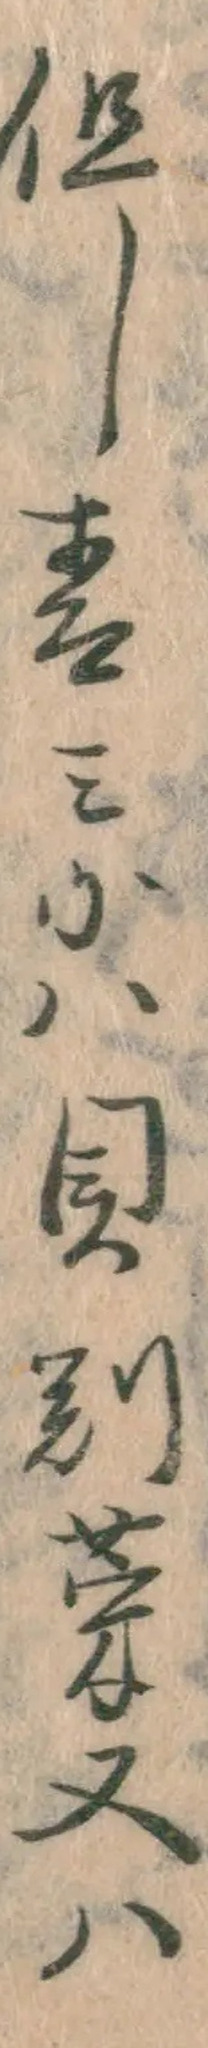但し青みには貝割菜又は
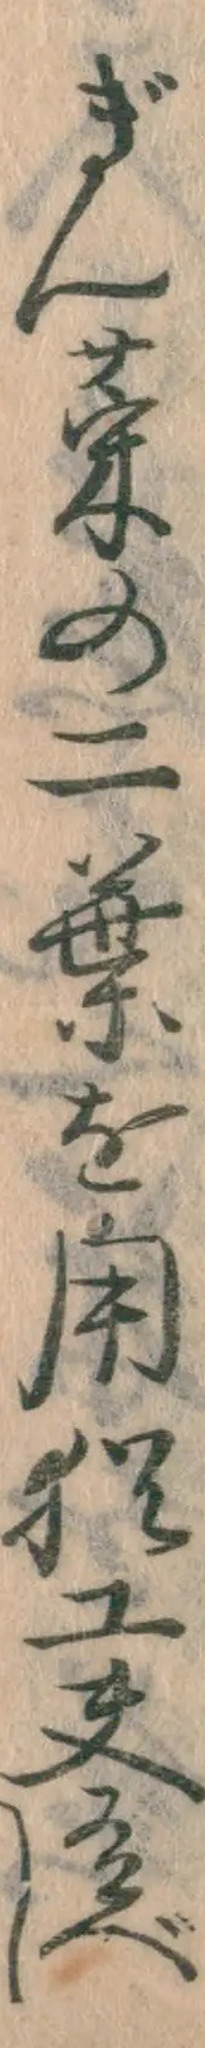ぎん菜の二葉を用猶工夫有べし
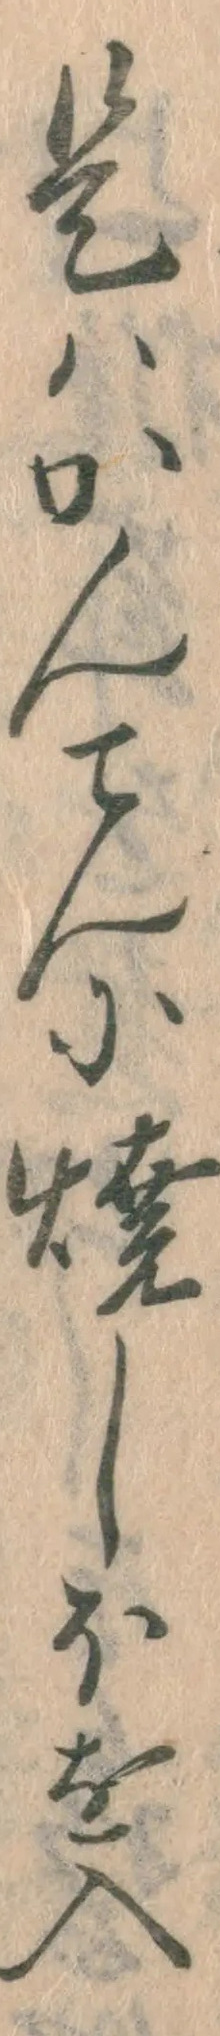是はかんてんに焼しほを入
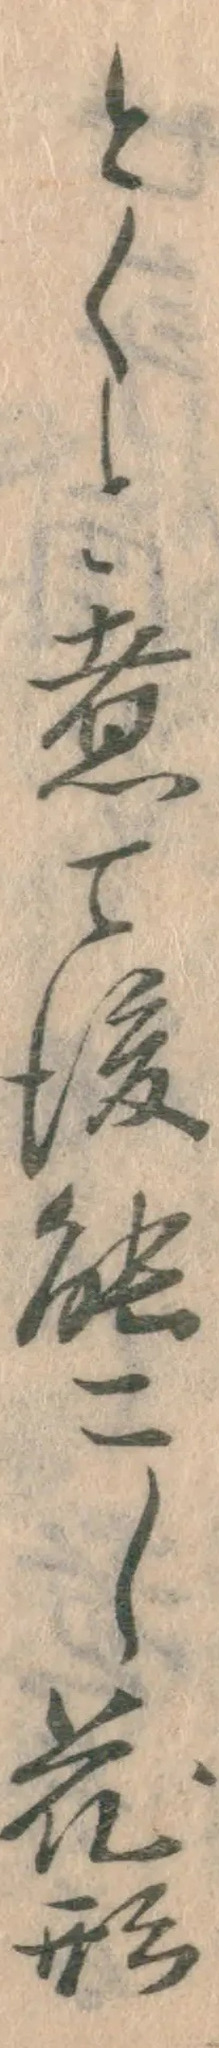とくと煮て後能こし花形
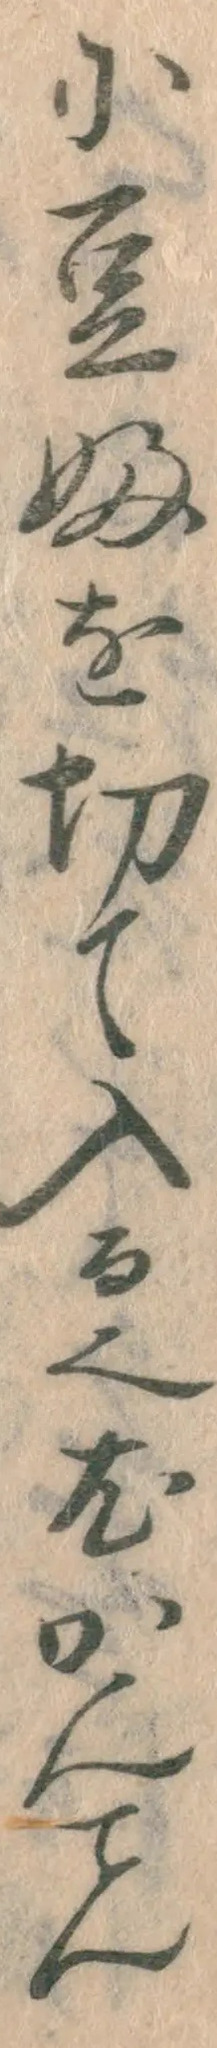に豆ふを切て入る也尤かんてん
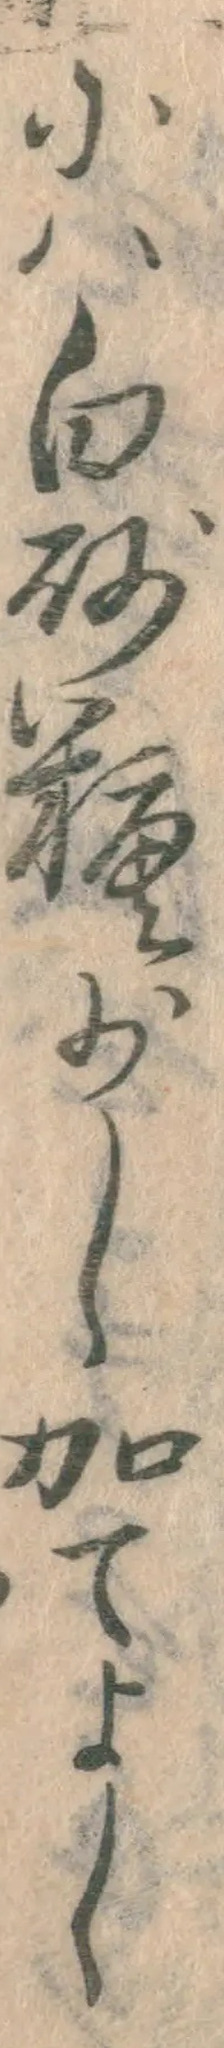には白砂糖少し加てよし
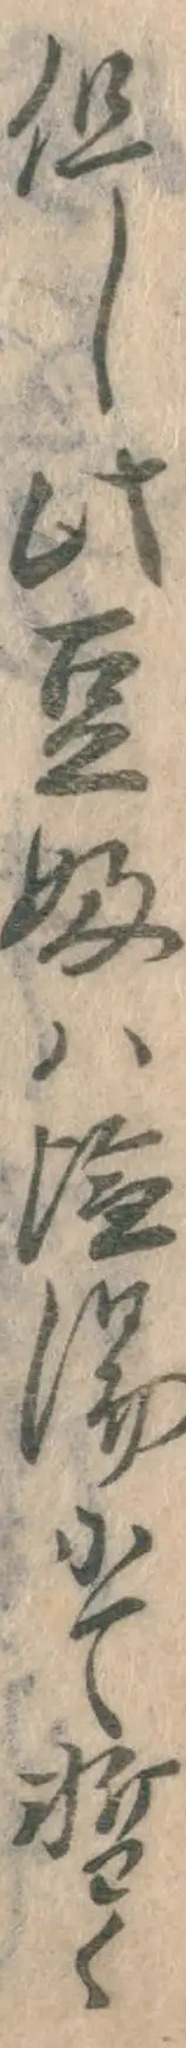但し此豆ふは塩湯にて暫く
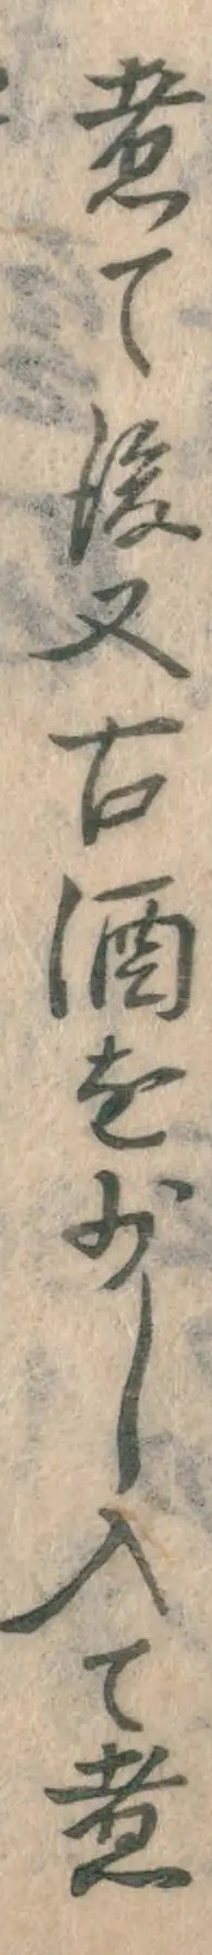煮て後又古酒を少し入て煮

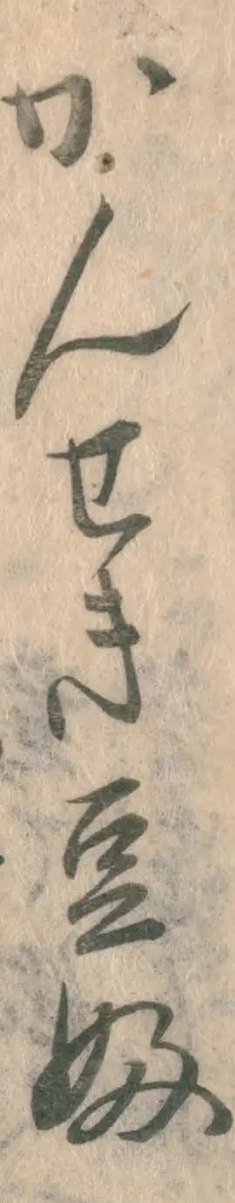かんせき豆ふ
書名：豆腐百珍余録
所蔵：国立国会図書館 National Diet Library, JAPAN
